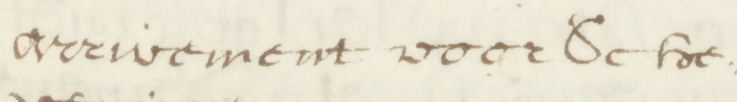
Arrivement voor Sche„
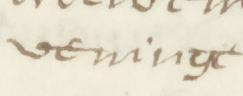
veninge
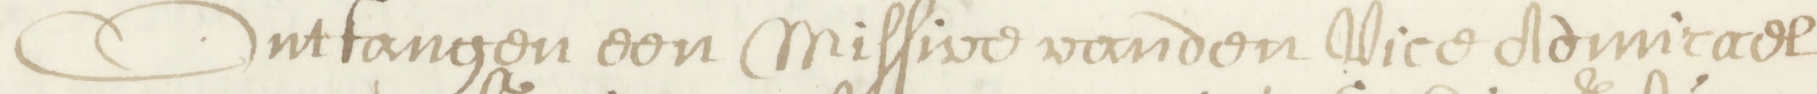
Ontfangen een Missive vanden Vice Admirael
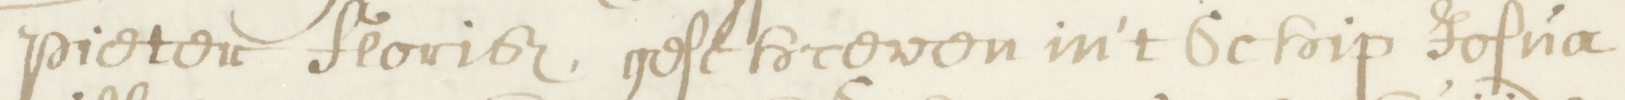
Pieter Florisz, geschreven in't Schip Josua
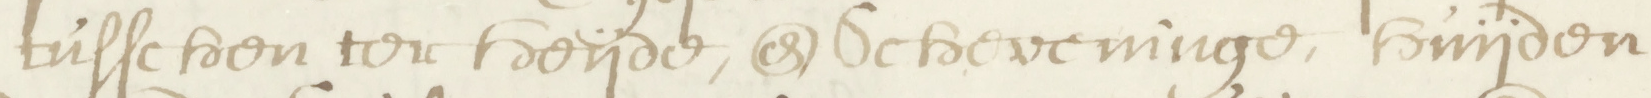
tusschen ter Heijde, & Scheveninge, huijden
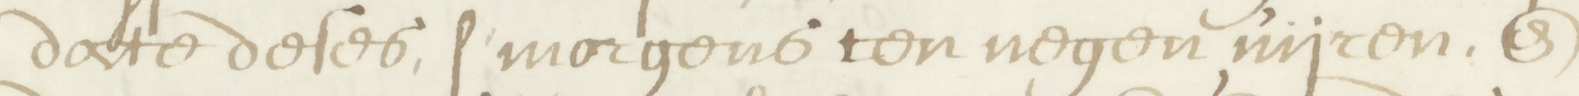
date deses, s‛morgens ten negen uijren. &
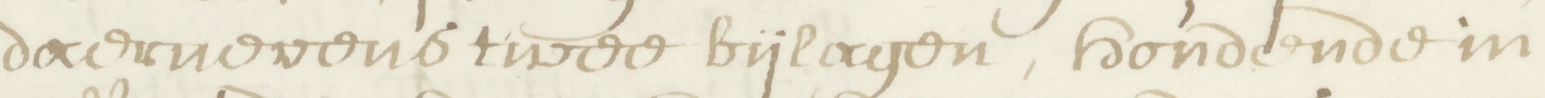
daernevens twee bijlagen, houdende in
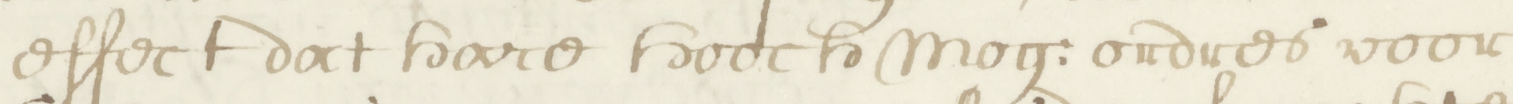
effect dat hare hooch Mog: ordres voor
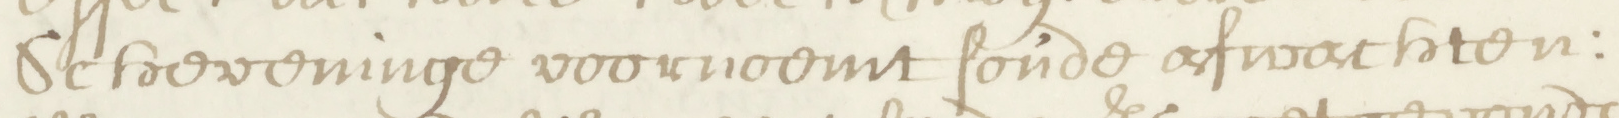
Scheveninge voornoemt soude afwachten:
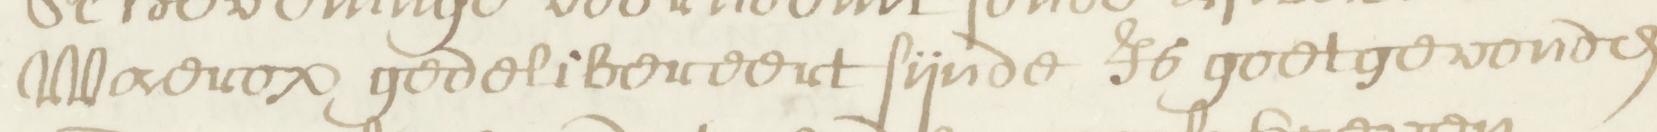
Waerop gedelibereert sijnde, Is goetgevonden
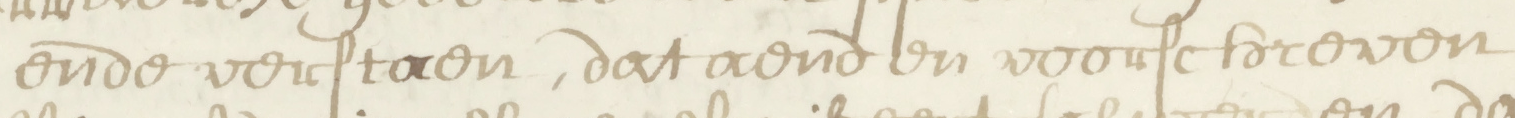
ende verstaen, dat aenden voorschreven
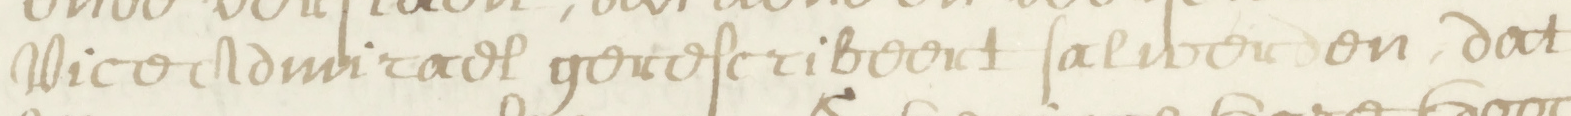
Vice Admirael gerescribeert sal werden, dat
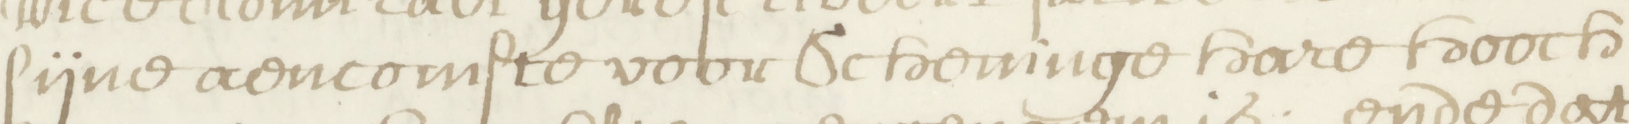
sijne aencomste voor Scheninge hare hooch
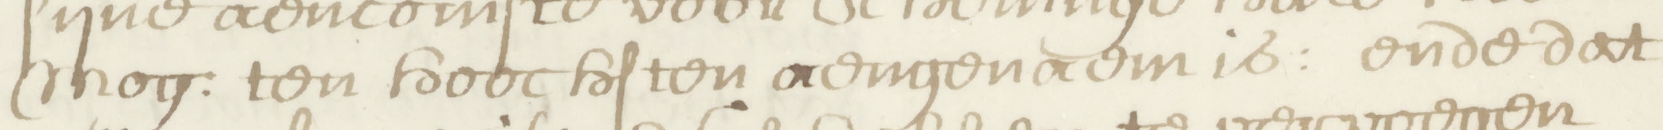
Mog: ten hoochsten aengenaem is: ende dat
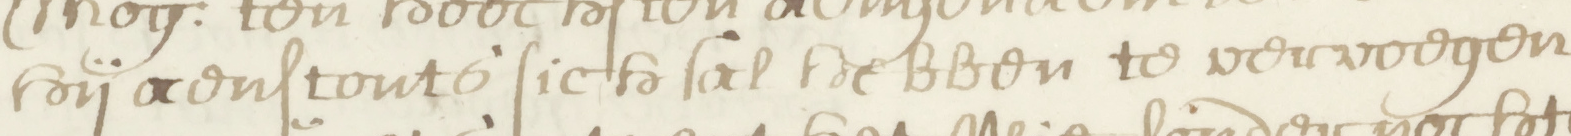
hij aenstonts sich sal hebben te vervoegen
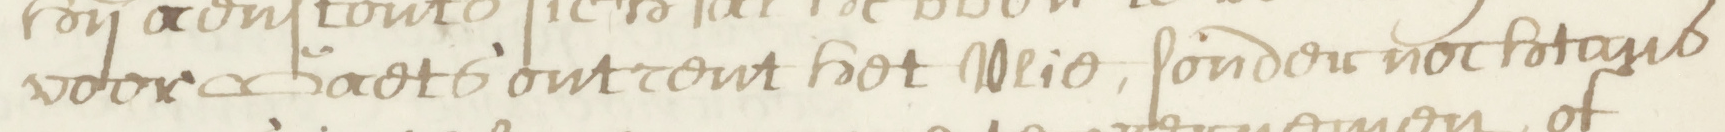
voor Gaets ontrent het Vlie, sonder nochtans
